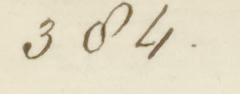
384.
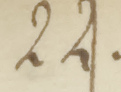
22.
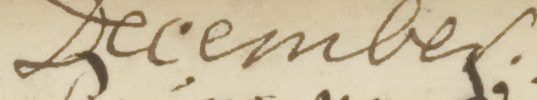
December.
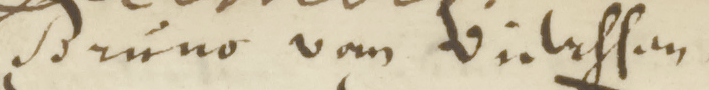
Bruno van Vierssen
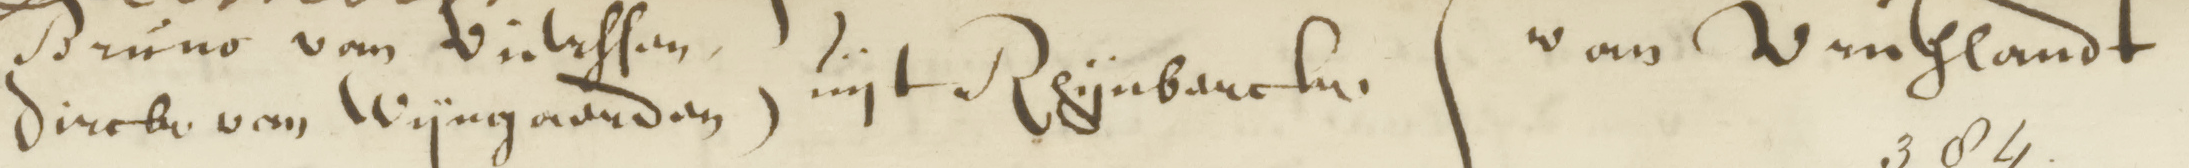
dirck van Wijngaerden uijt Rhijnberck van Vrieslandt
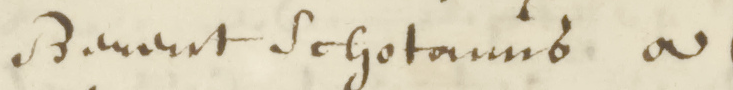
Berent Schotanus a
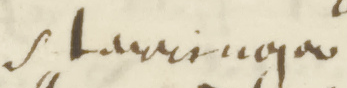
Sterringa
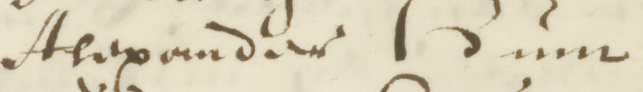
Alexander Hum
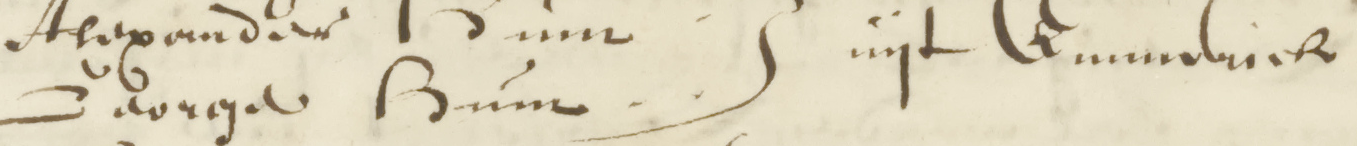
Georgge Hum uijt Emmerick
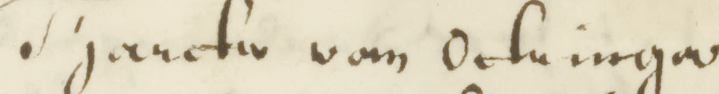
Tjarck van Ockinga
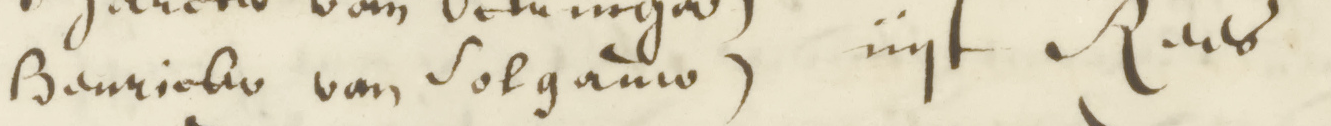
Henrick van Solgauw uijt Rees
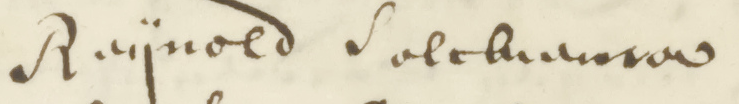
Reijnold Solckena
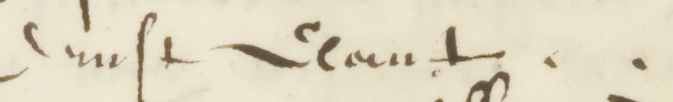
Ernst Clant
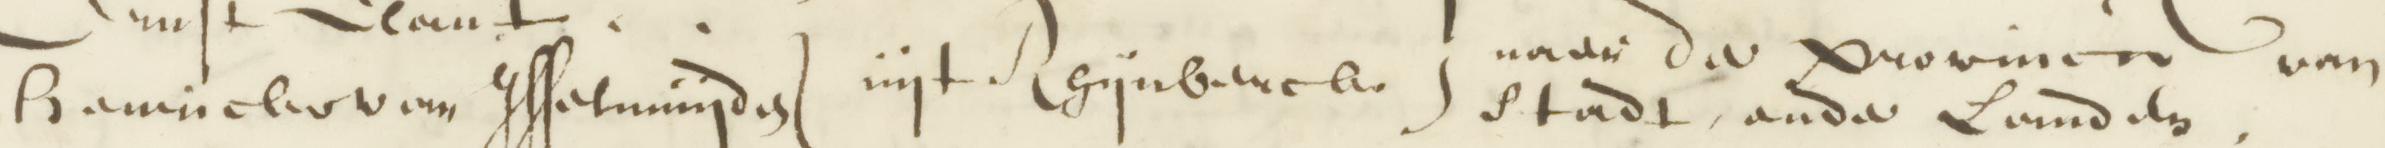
Henrick van Isselmuijden uijt Rhijnberck naer de Provincie van
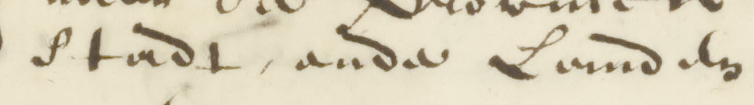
Stadt, ende Landen
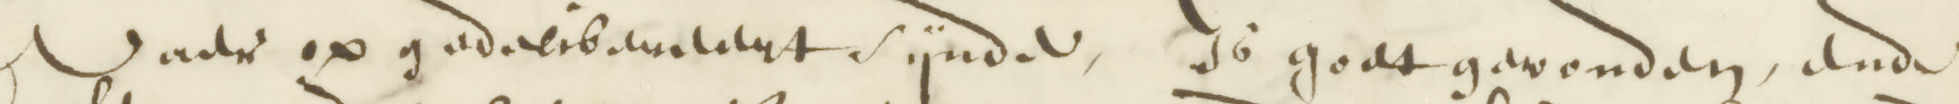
Waer op gedelibereert sijnde, Is goetgevonden, ende
